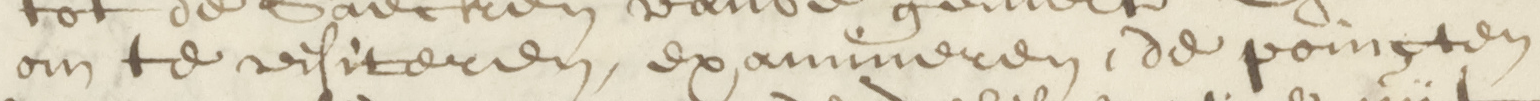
om te visiteren, examineren, de poincten
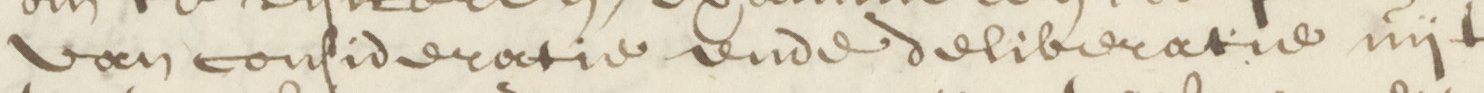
van consideratie ende deliberatie uijt
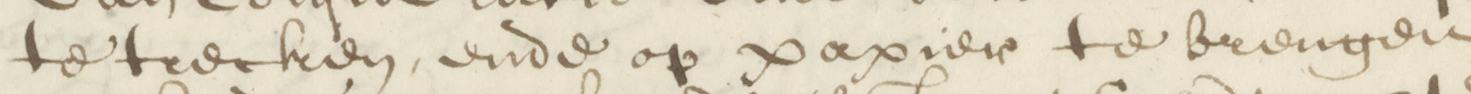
te trecken, ende op papier te brengen
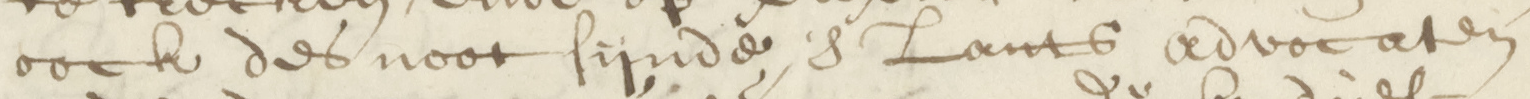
oock des noot sijnde ‛s Lants Advocaten
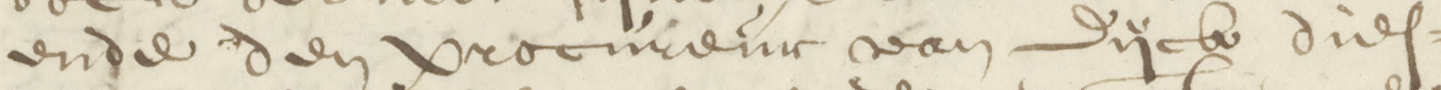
ende den Procureur van Dijck dies=
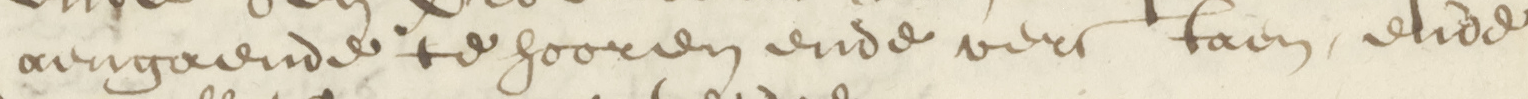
aengaende te hooren ende verstaen, ende
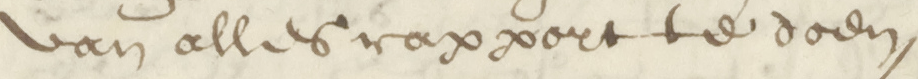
van alles rapport te doen.
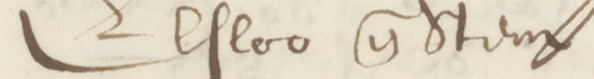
Elsloo & Stein
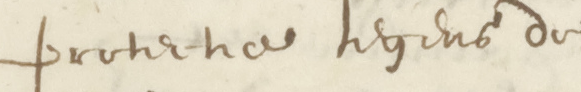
protectie tegens de
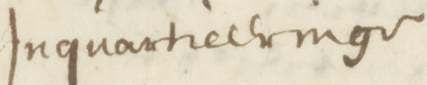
Inquartieeringe
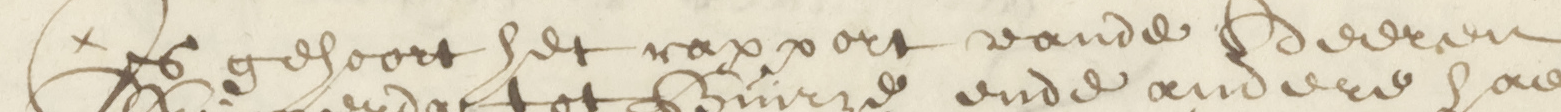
Is gehoort het rapport vande Heeren
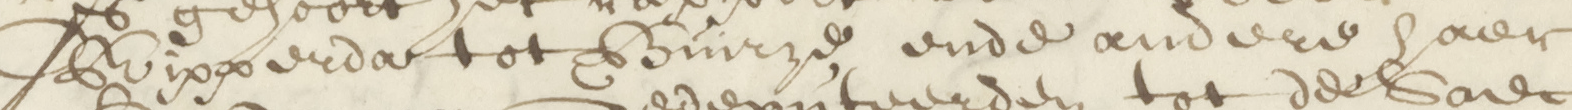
Ripperda tot Buirze ende andere haer
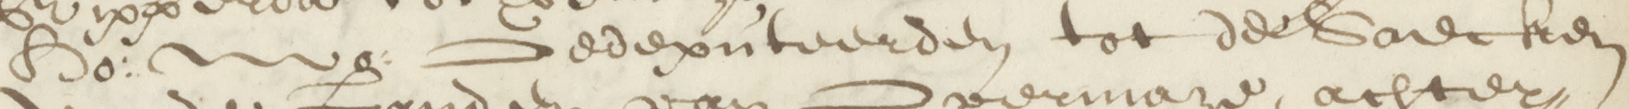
Ho:Mo: Gedeputeerden tot de Saecken
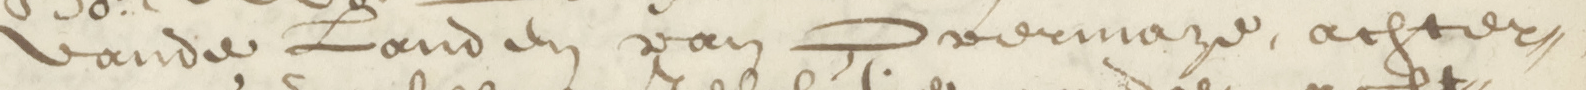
vande Landen van Overmaze, achter„
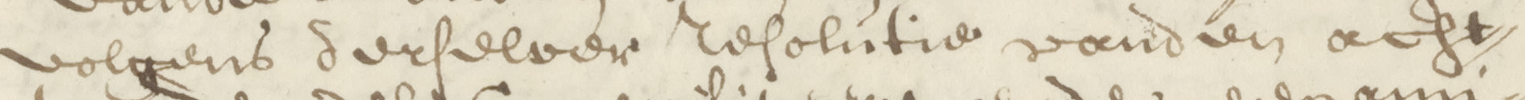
volgens derselver resolutie vanden acht„
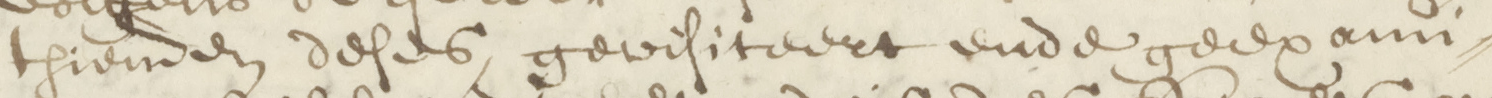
tienden deses, gevisiteert ende geexami„
